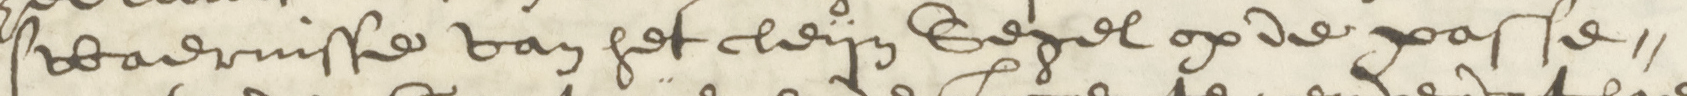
swaernisse van het cleijn Segel op de passe„
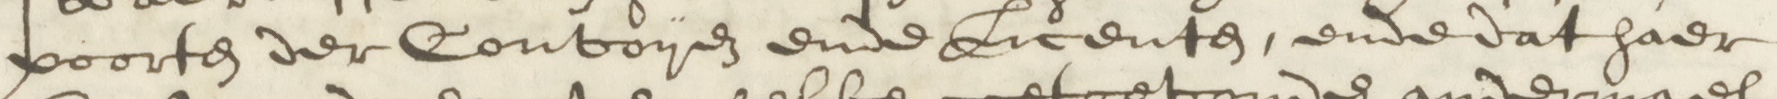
poorten der Convoijen ende Licenten, ende dat haer
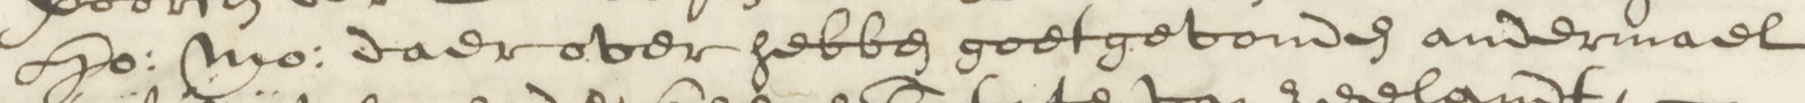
Ho:Mo: daer over hebben goetgevonden andermael
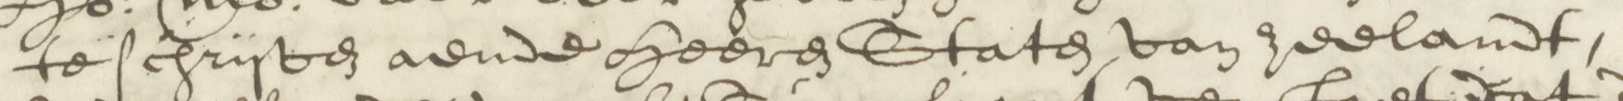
te schrijven aende heeren Staten van zeelandt.
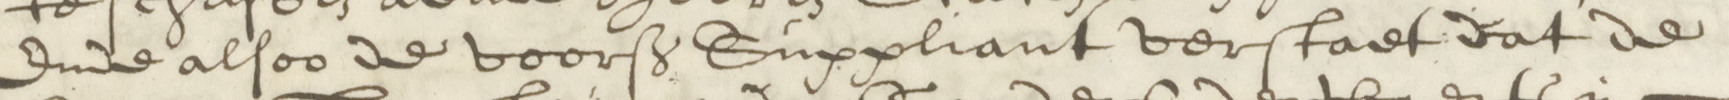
Ende alsoo de voors Suppliant verstaet dat de
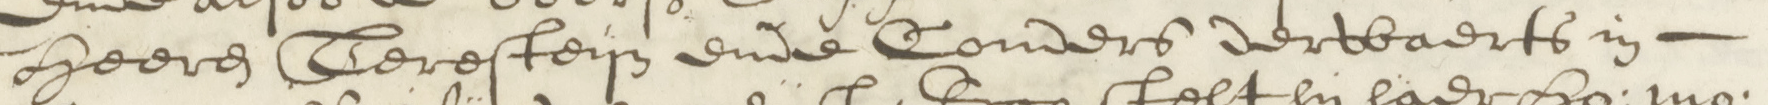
heeren Teresteijn ende Conders derwaerts in -
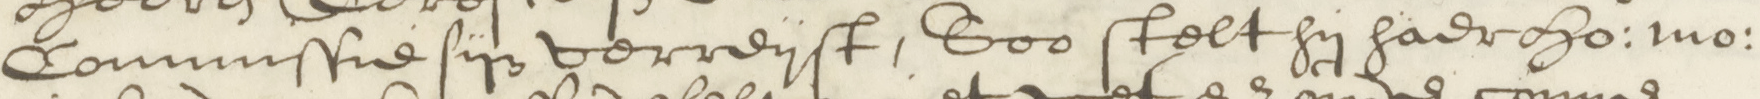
Commissie sijn verreijst, Soo stelt hij haer Ho:mo:
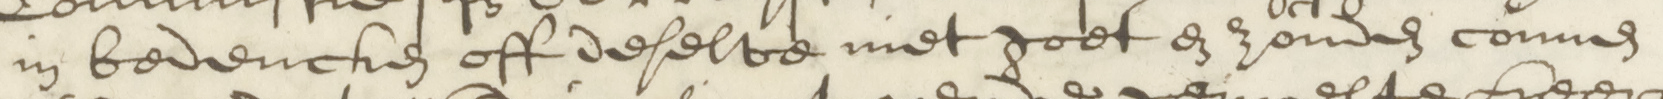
in bedencken off deselve niet goet en zouden connen
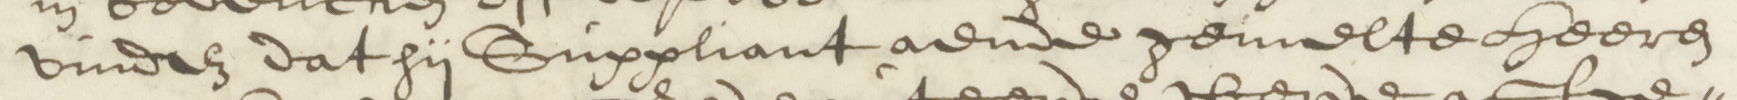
vinden dat hij Suppliant aende gemelte heeren
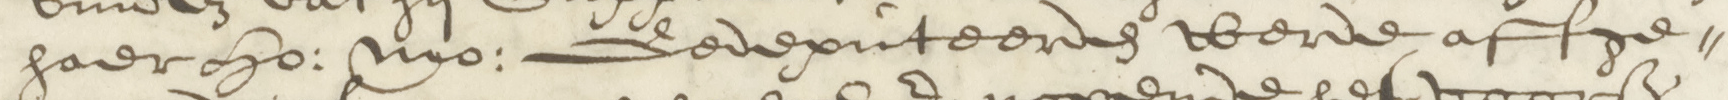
haer Ho:Mo: Gedeputeerden werde affge„
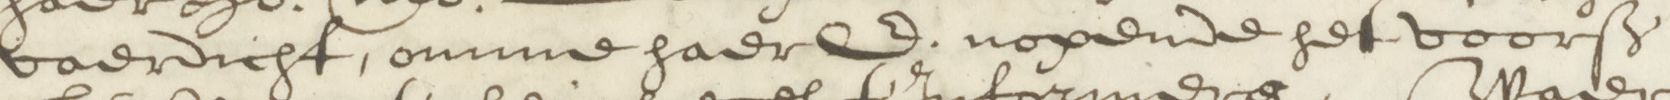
vaerdicht, omme haer E. nopende het voors
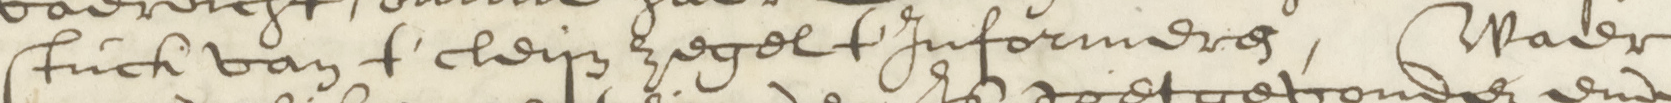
stuck van t'cleijn zegel t‛ Informeren. Waer
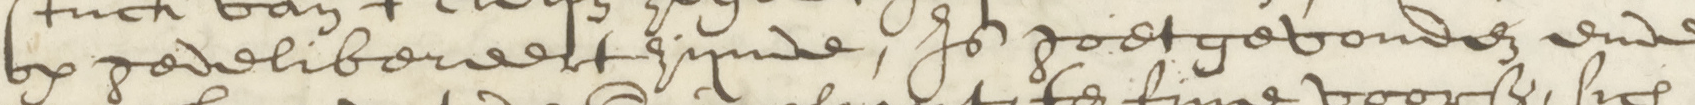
op gedelibereert zijnde, Is goetgevonden ende
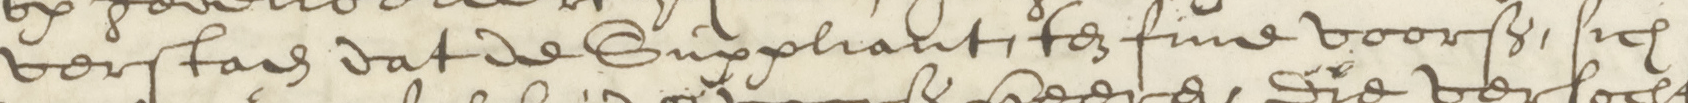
verstaen dat de Suppliant, ten fine voors, sich
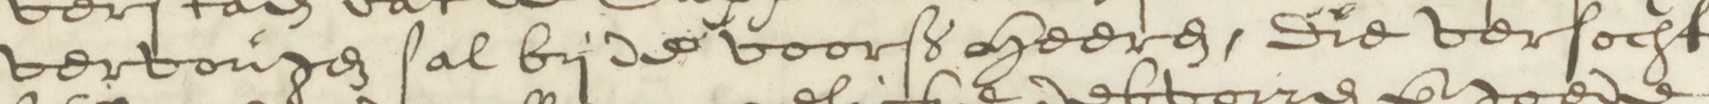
vervougen sal bij de voors heeren, die versocht
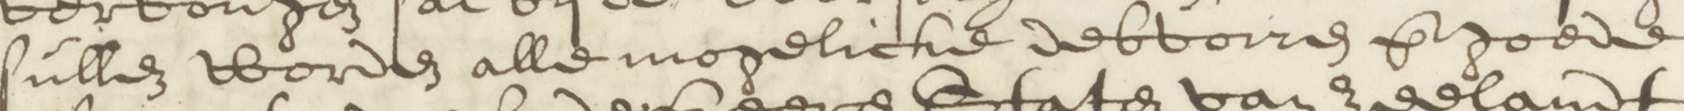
sullen worden alle mogelicke debvoiren & goede
